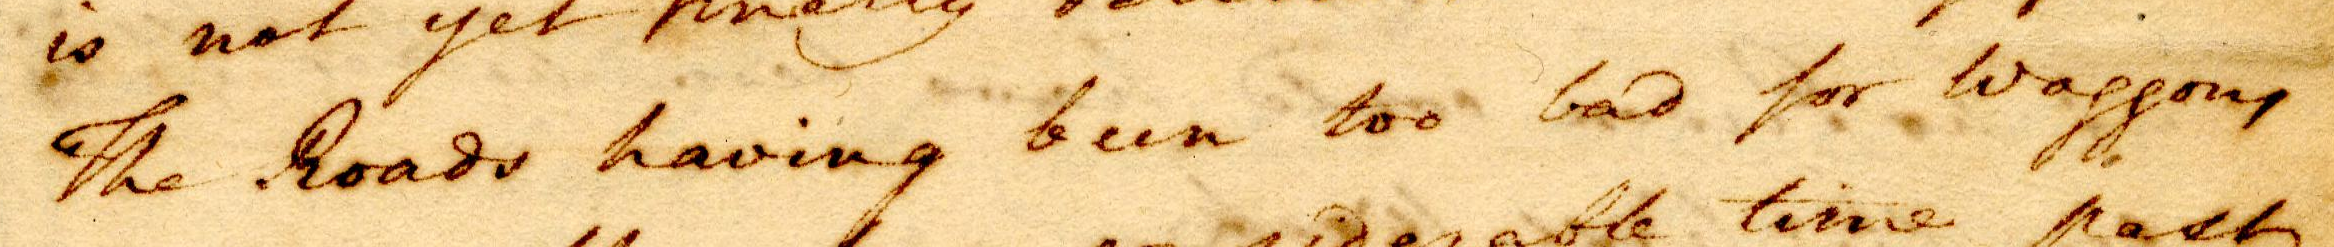The Roads having been too bad for Waggons
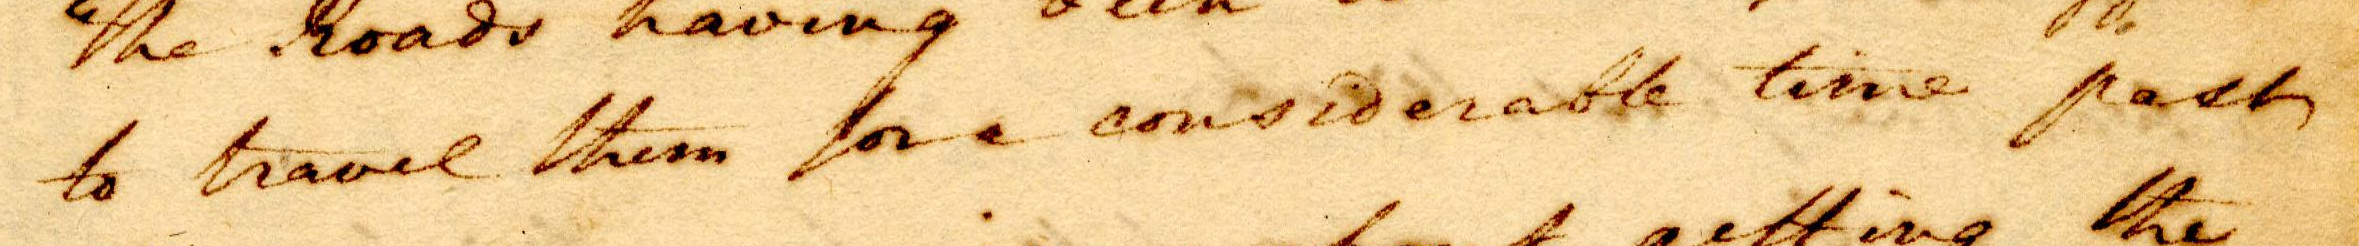to travel them for a considerable time past
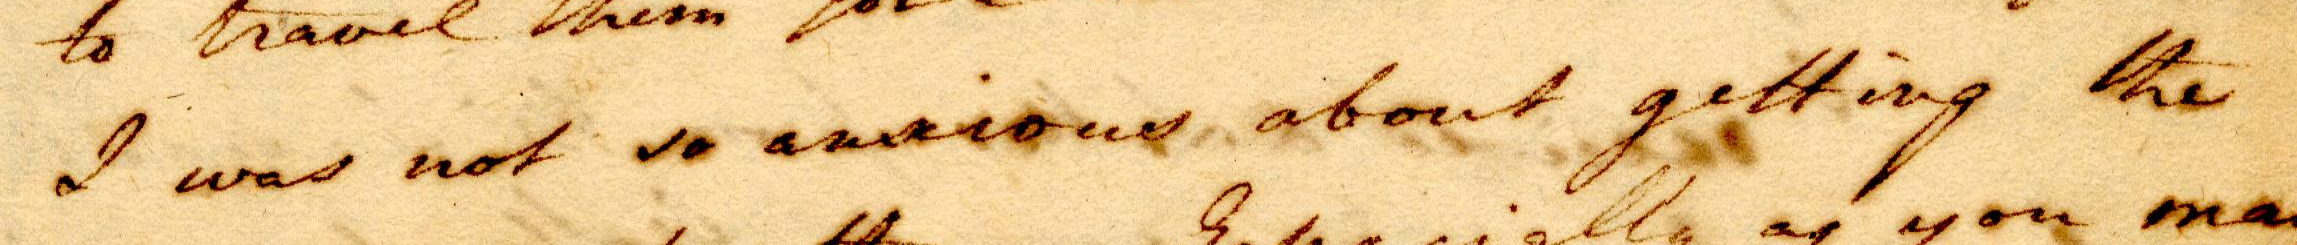I was not so anxious about getting the
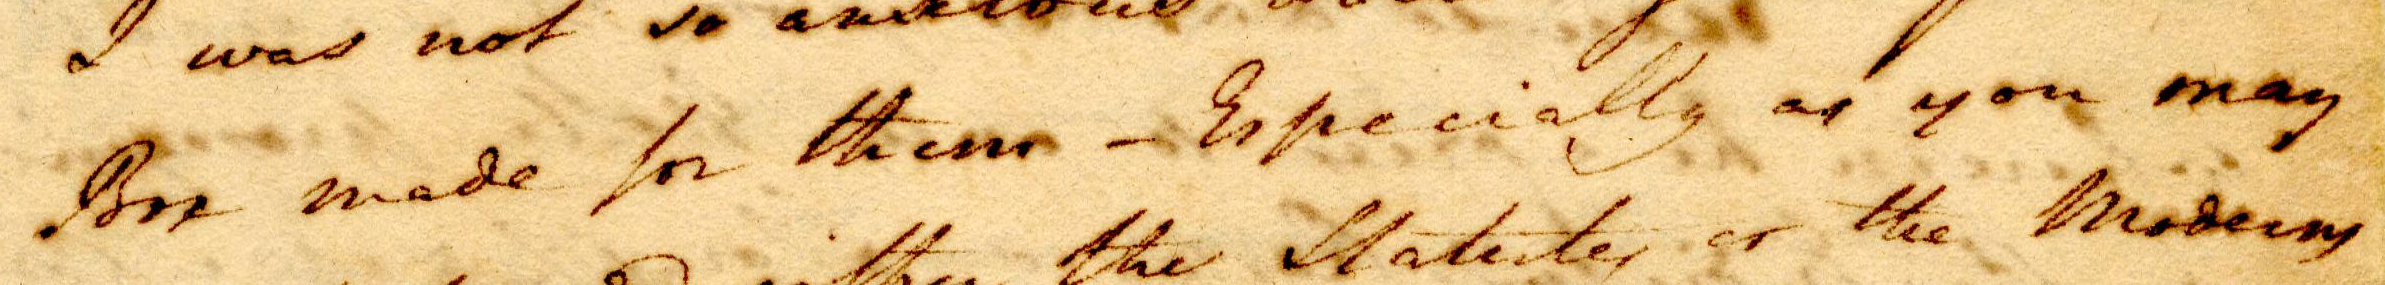Box made for them. Especially as you may
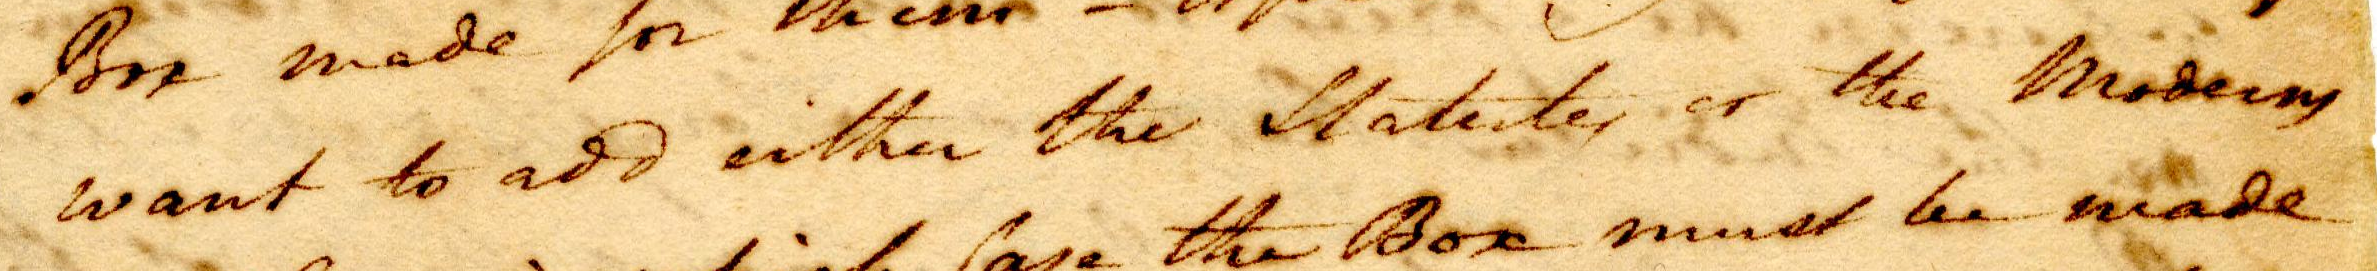want to add either the Stateites or the Modern
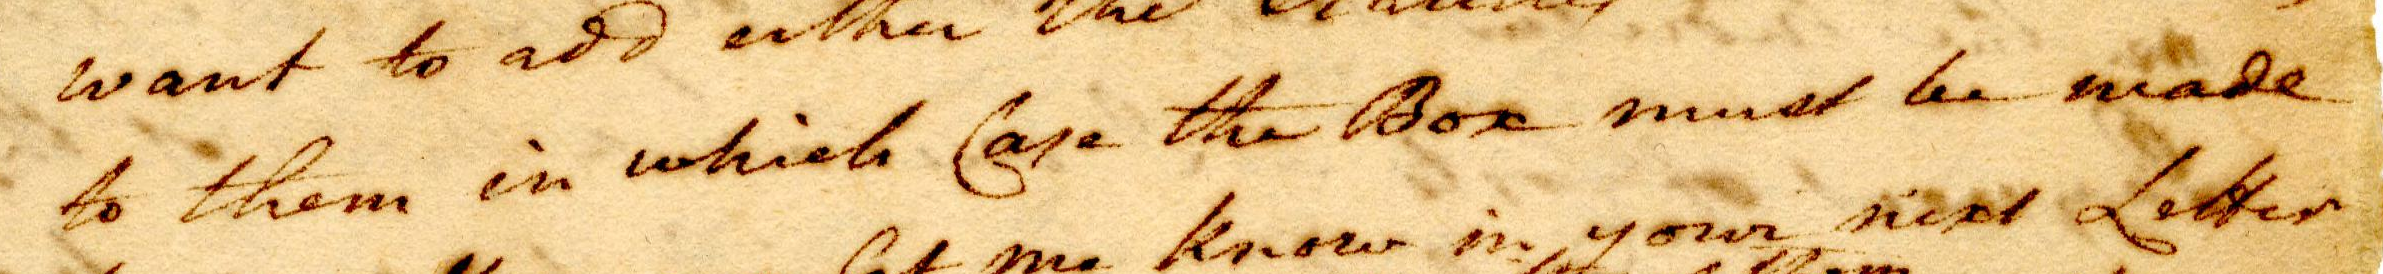to them in which Case the Box must be made
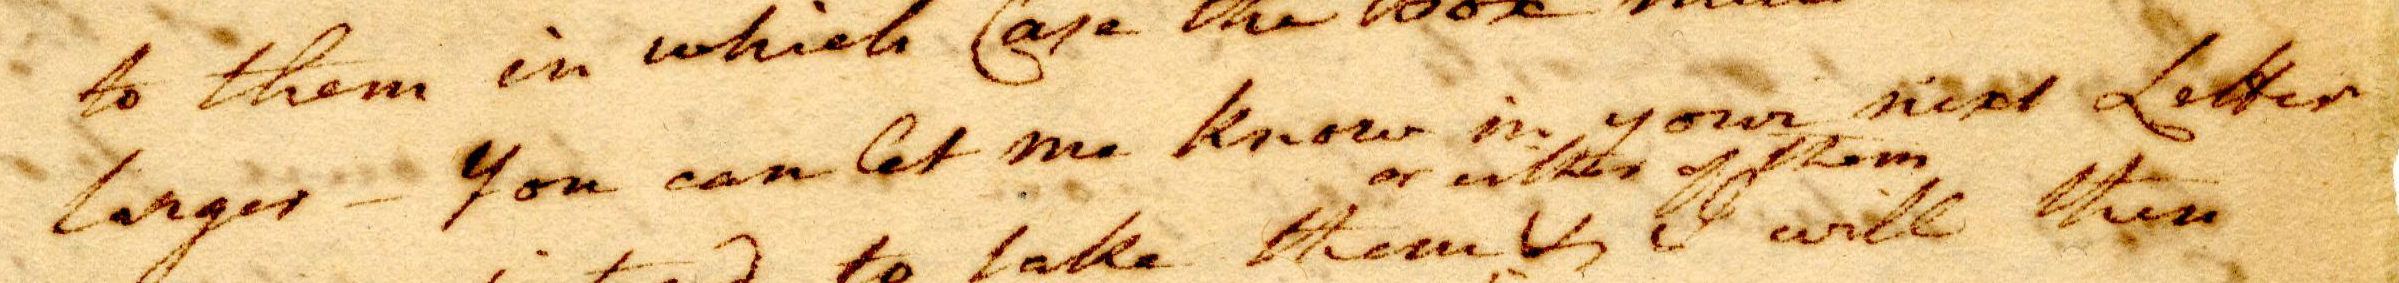larger. You can let me know in your next Letter
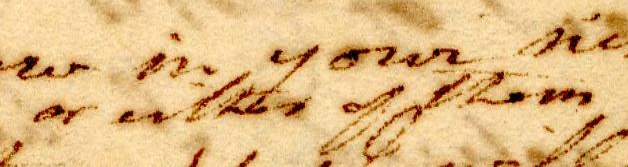or either of them
